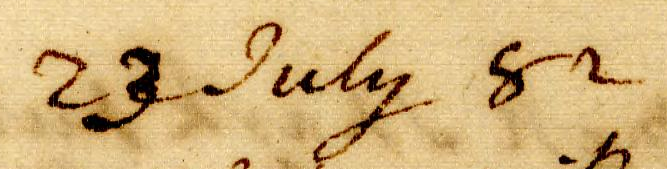23 July 82
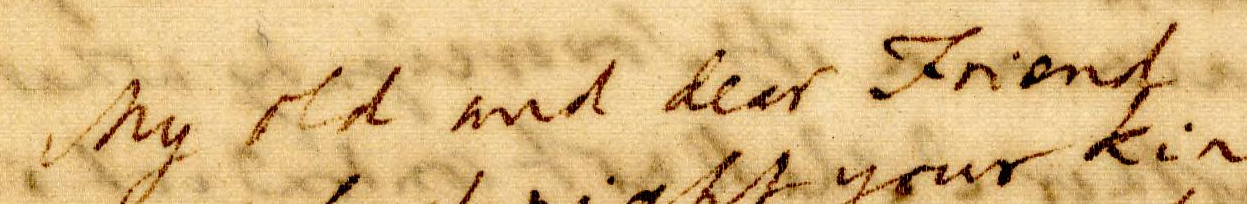My old and dear Friend
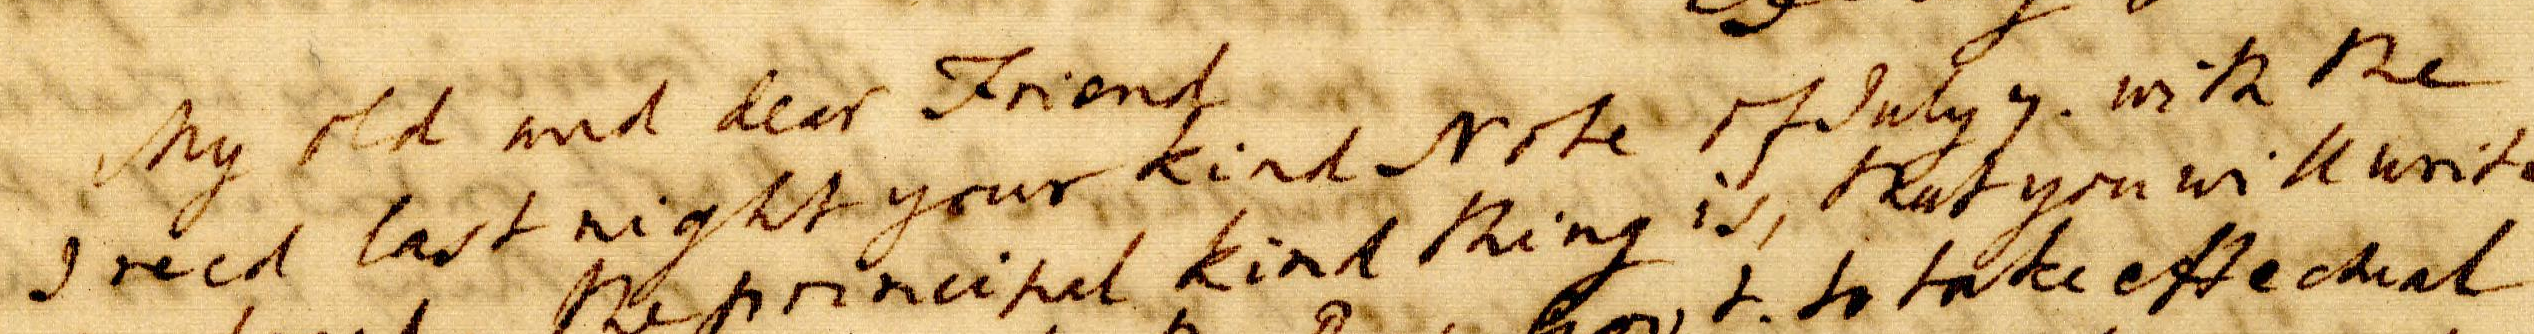I recd last right your kind Note of July 7. with the
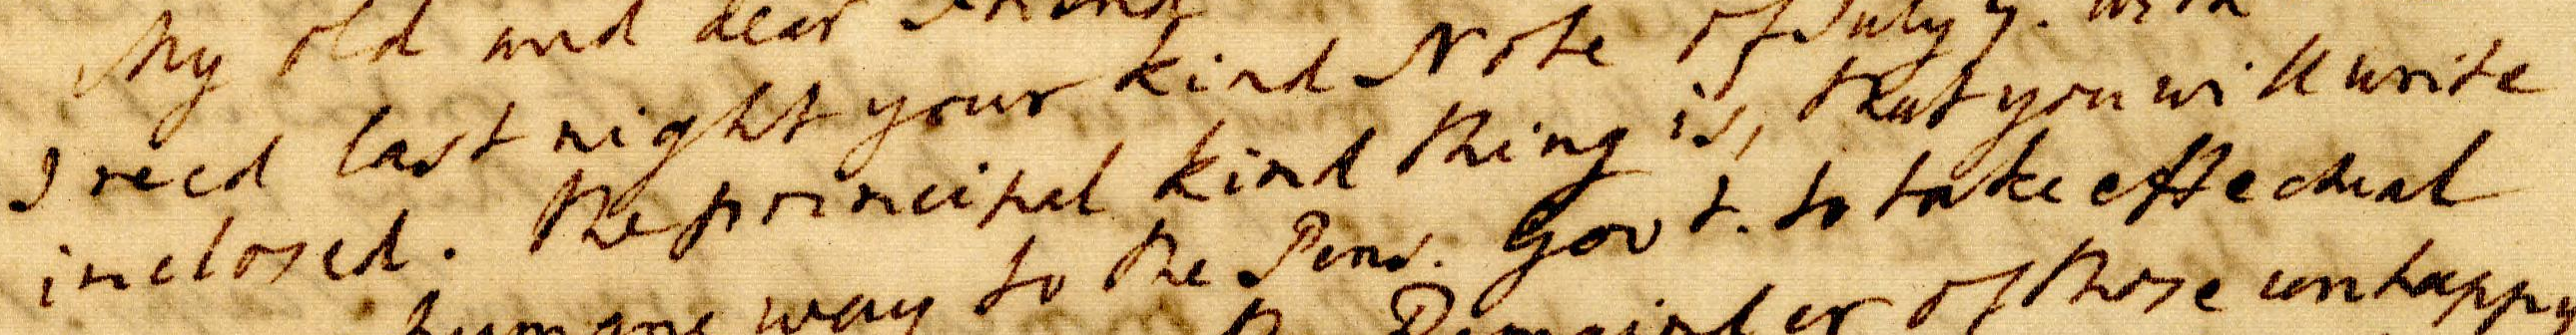inclosed. The principal kind thing is, that you will write
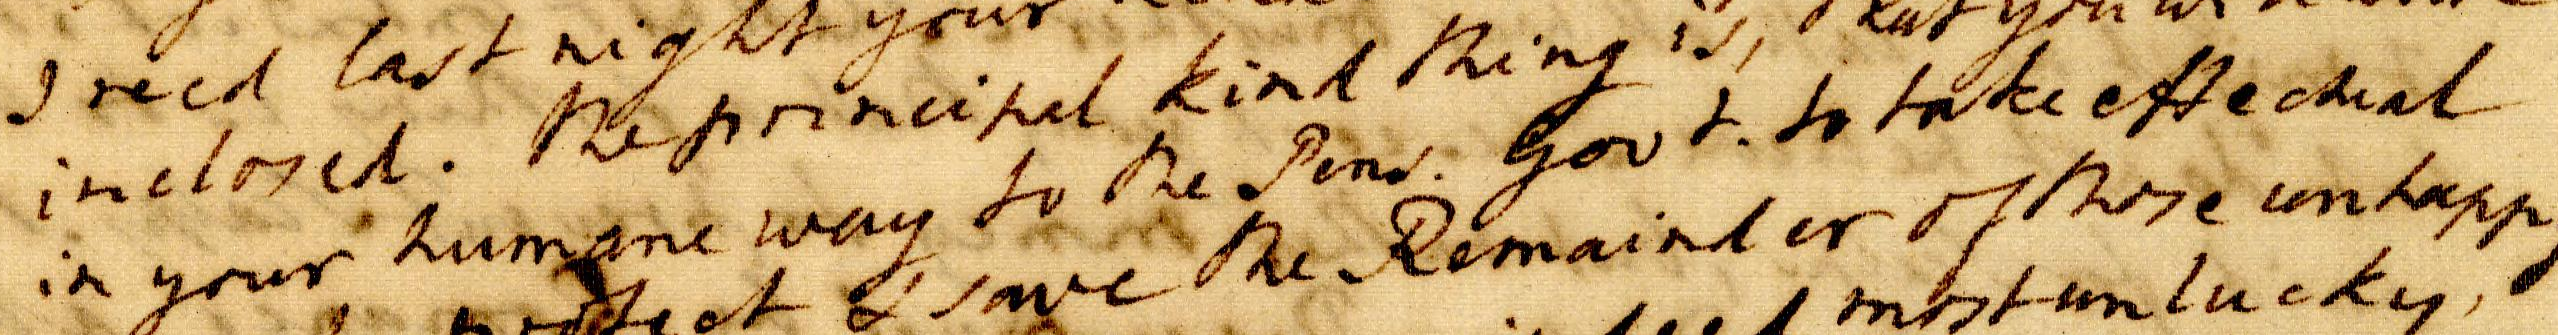in your humane way to the Pens. Govt. to take effectual
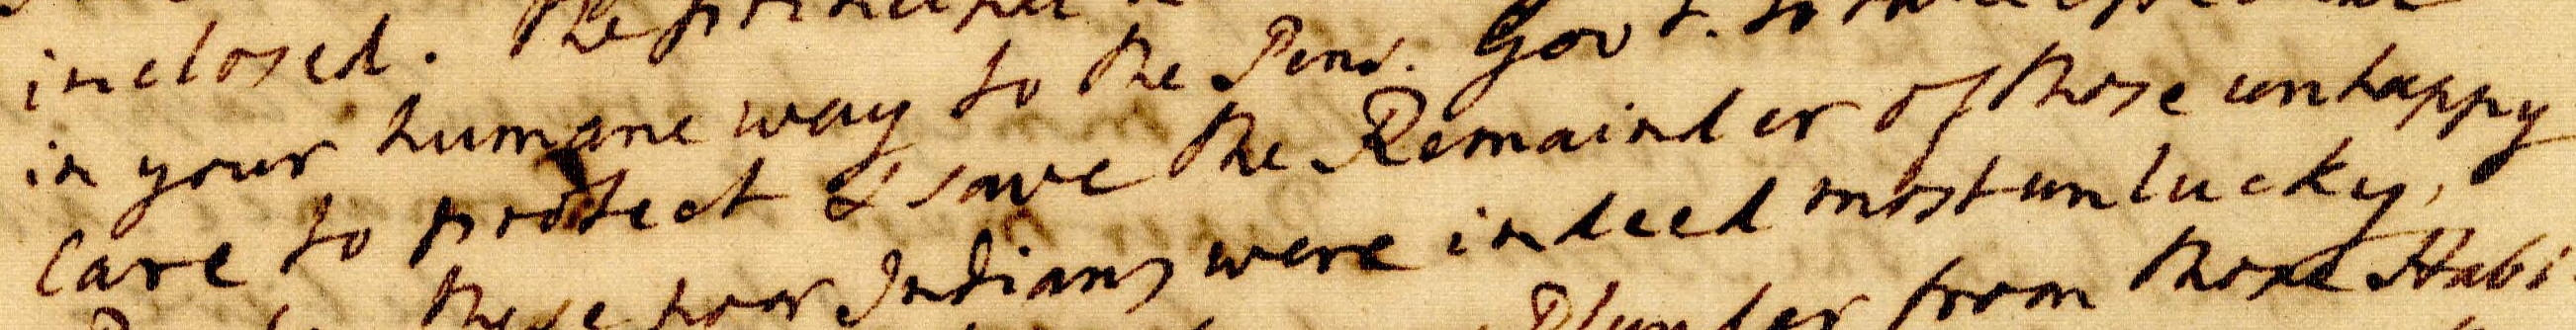Care to protect & save the Remainder of those unhappy
